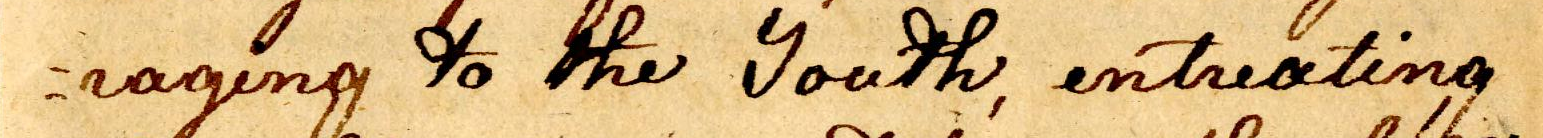-raging to the Youth, entreating
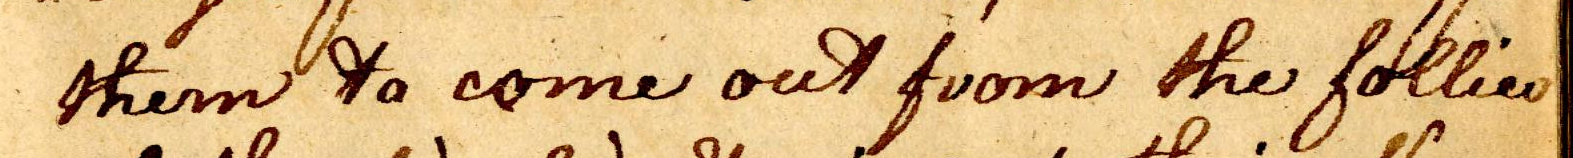them to come out from the follies
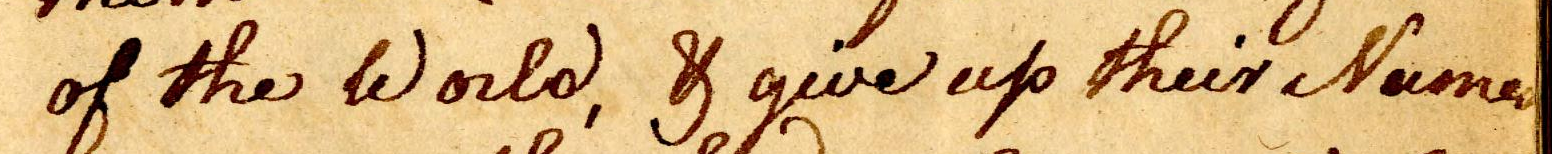of the World, & give up their Name
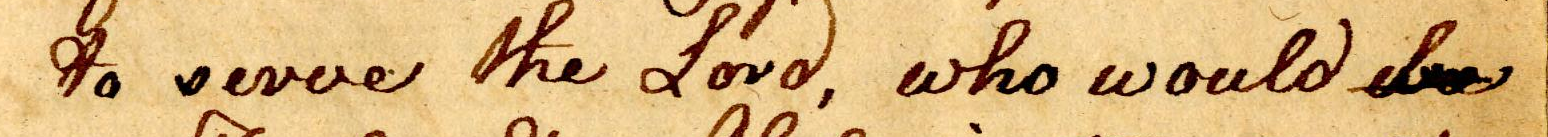to serve the Lord, who would [be]
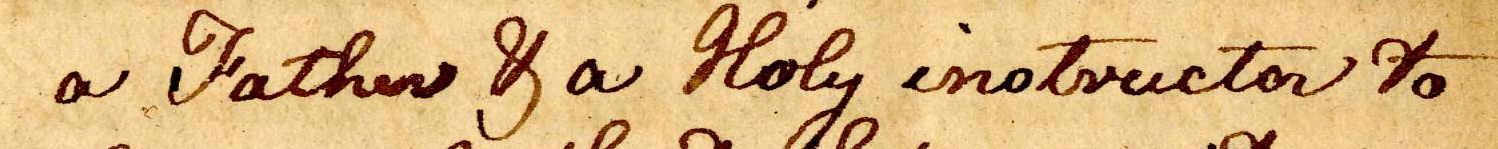a Father & a Holy instructor to
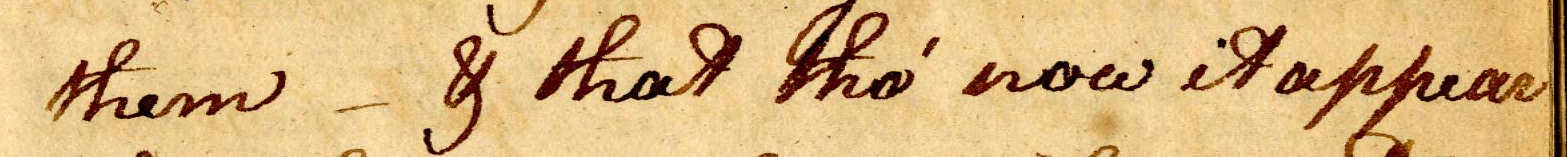them- & that tho' now it appear
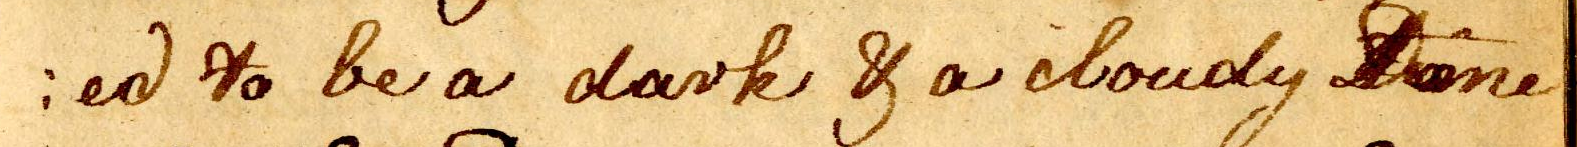-ed to be a dark & a cloudy [Dine]
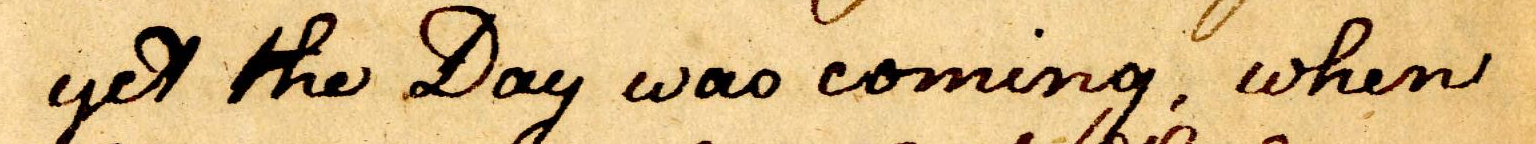yet the Day was coming, when
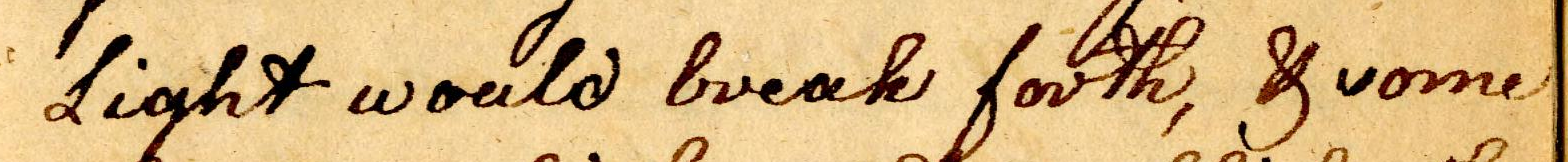Light would break forth, & some
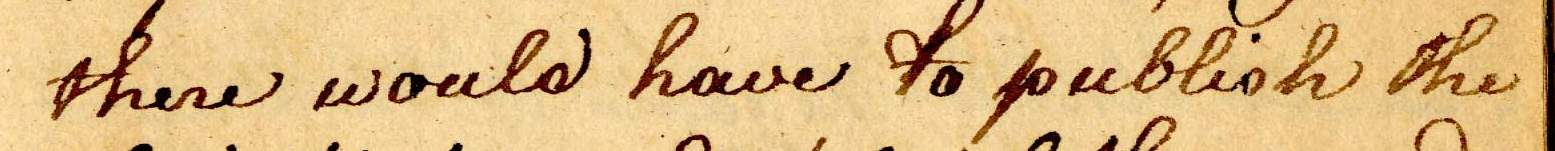there would have to publish the
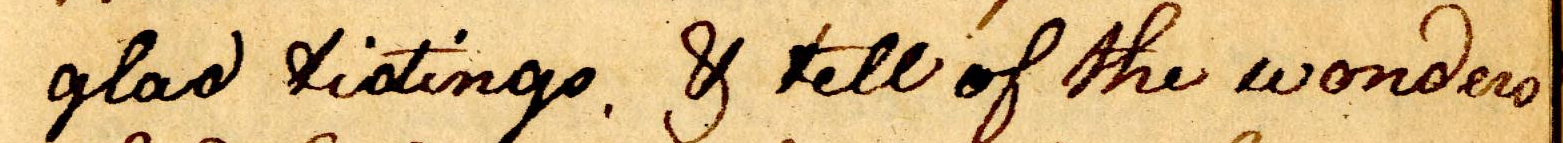glad tidings, & tell of the wonders
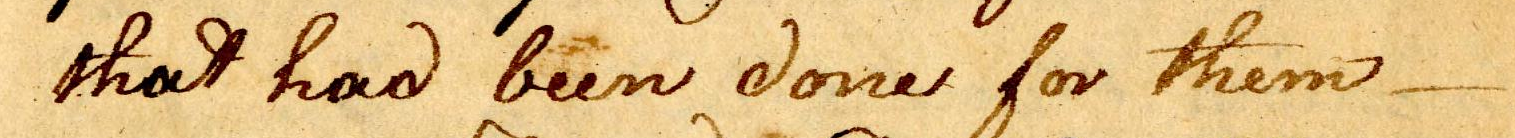that had been done for them-
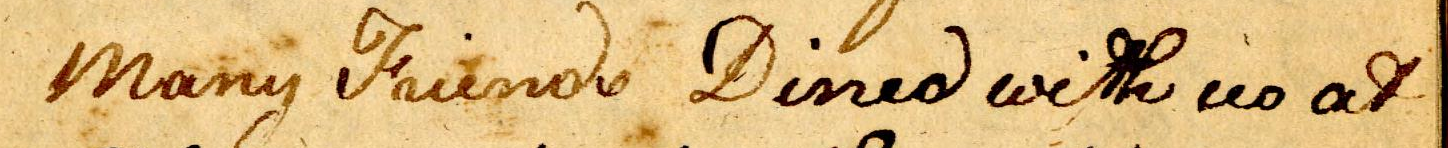Many Friends Dined with us at
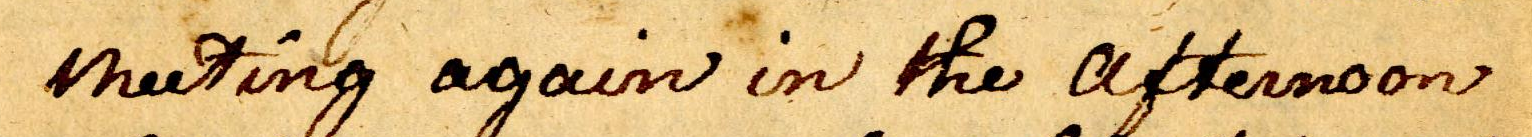Meeting again in the Afternoon
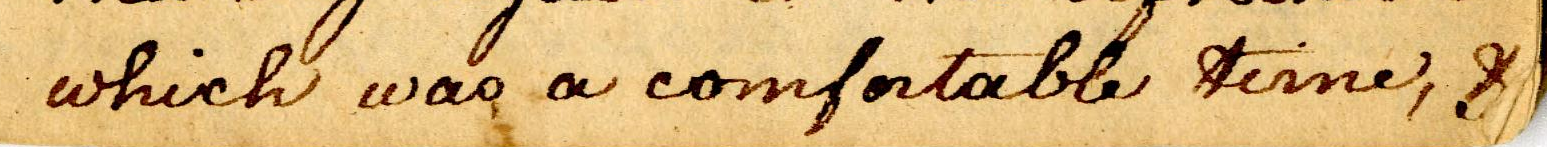which was a comfortable time, &
